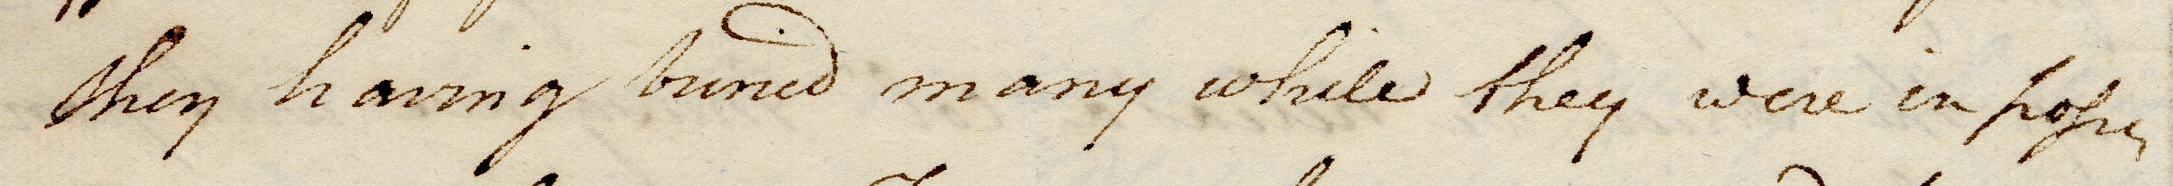they having buried many while they were in posse
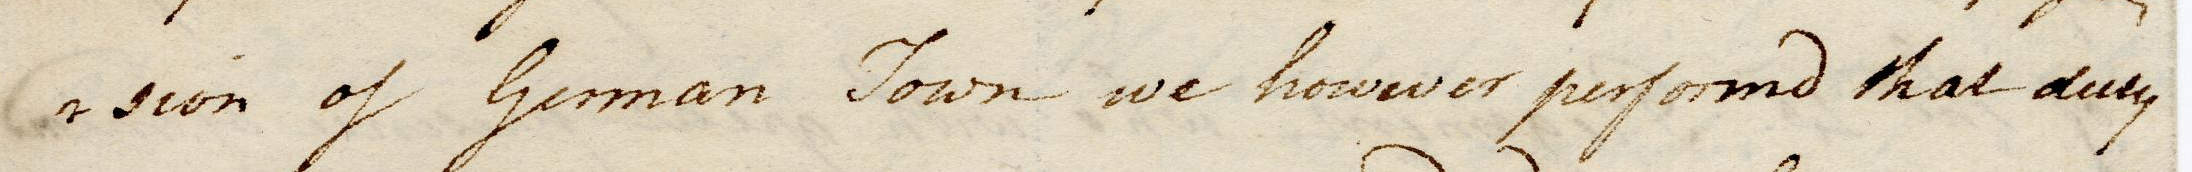ssion of German Town we however perform'd that duty
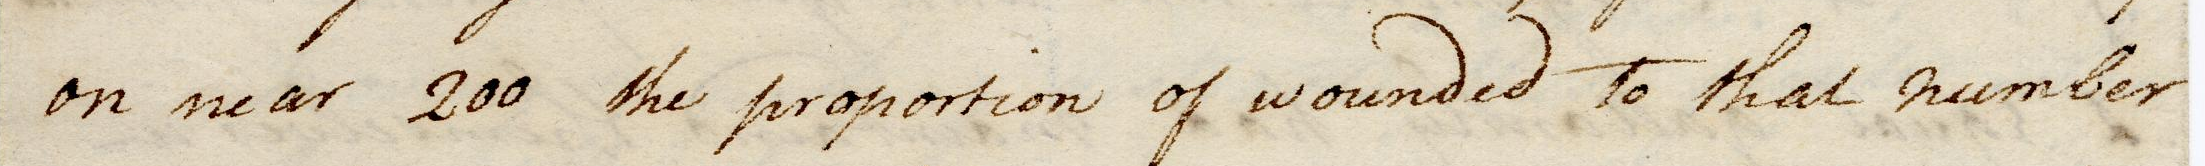on near 200 the proportion of wounded to that number
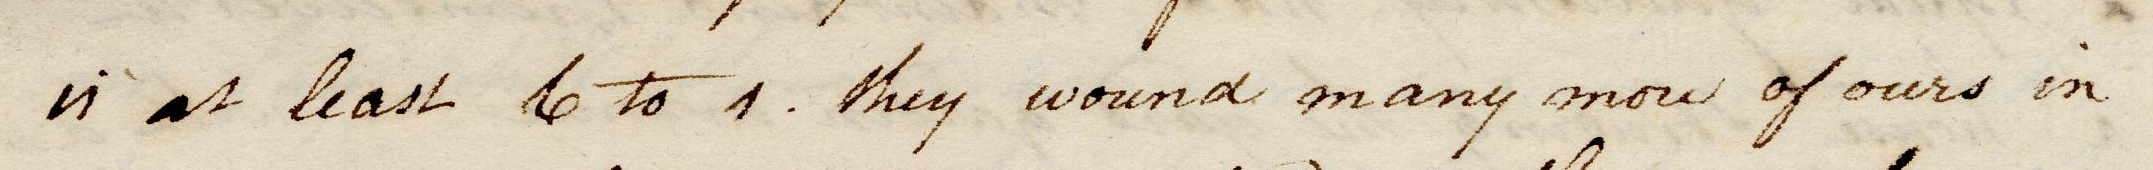is at least 6 to 1. they wound many more of ours in
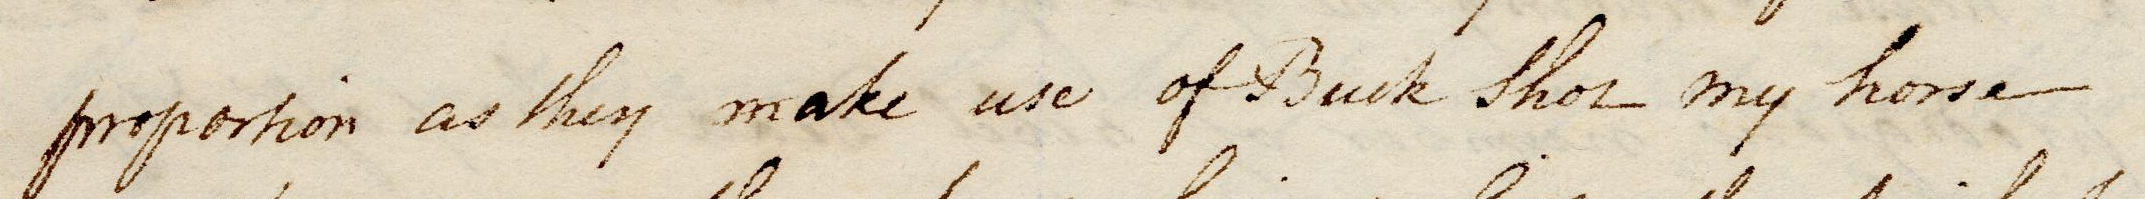proportion as they make use of Buck shot my horse
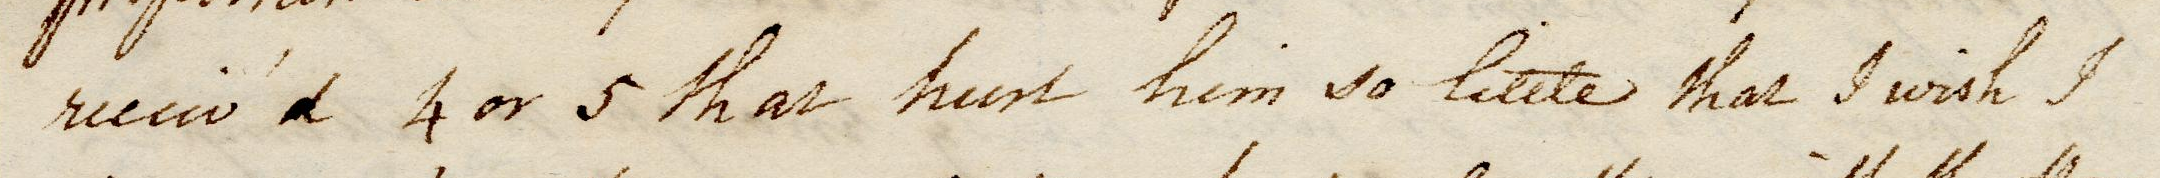receiv'd 4 or 5 that hurt him so little that I wish I
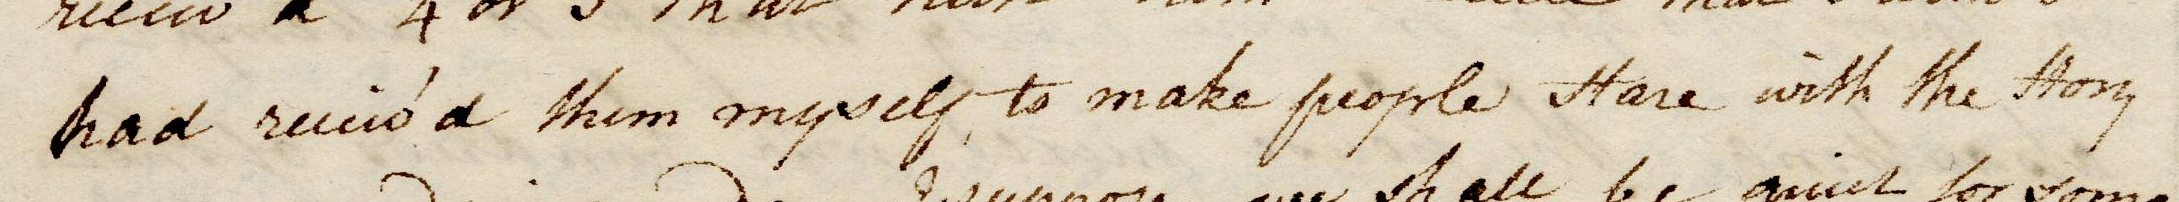had receiv'd them myself to make people stare with the story
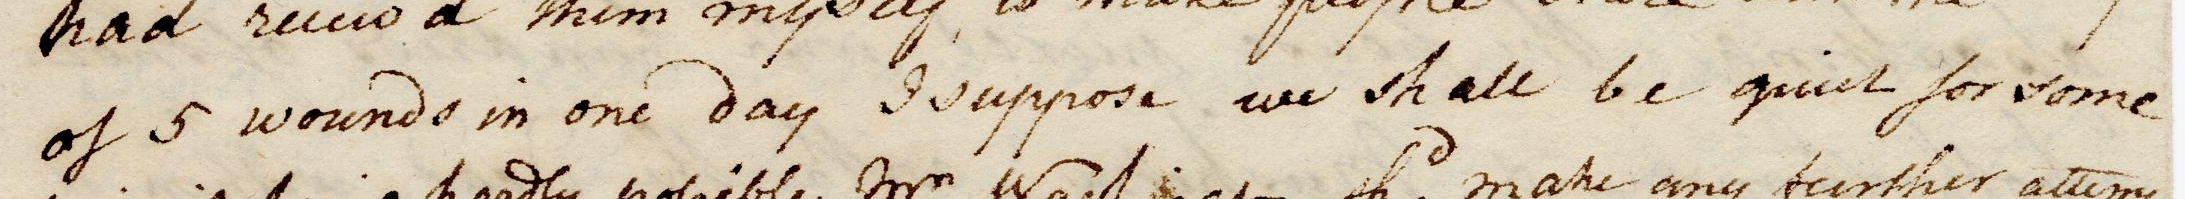of 5 wounds in one day I suppose we shall be quiet for some
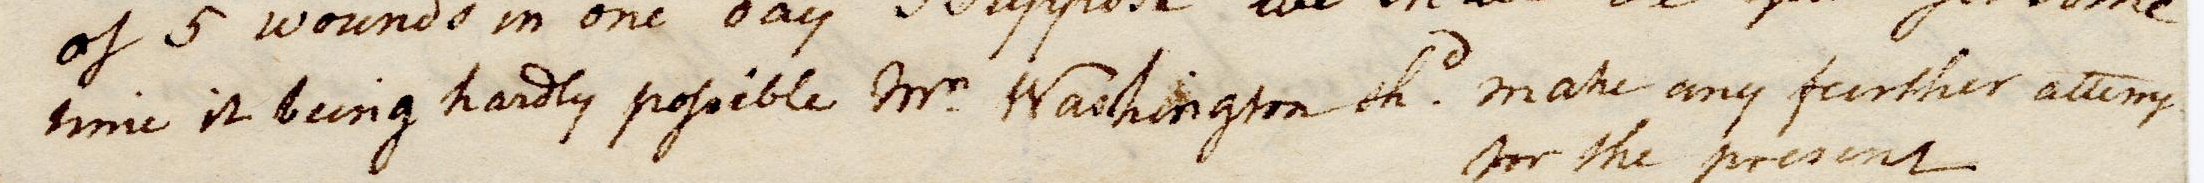time it being hardly possible M^r. Washington sh^d. make any further attemp
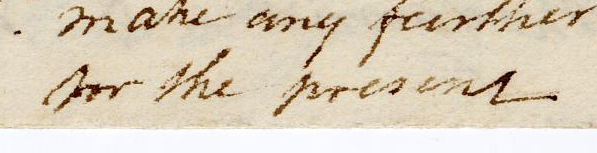for the present
